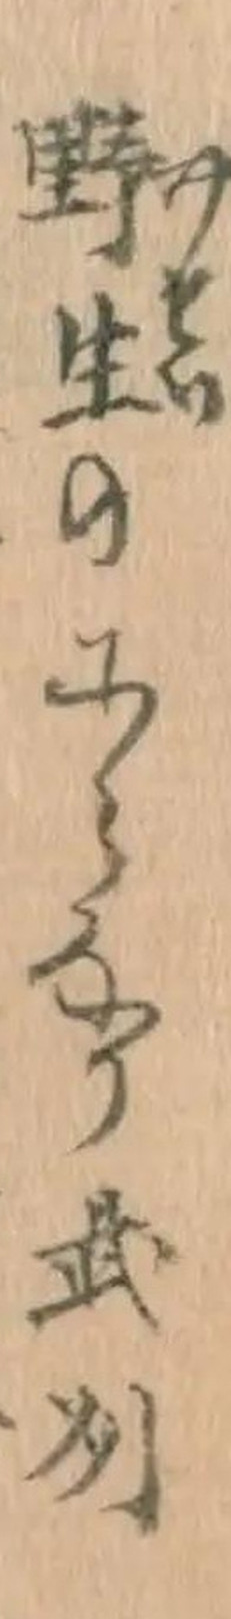野生のにらなり武州
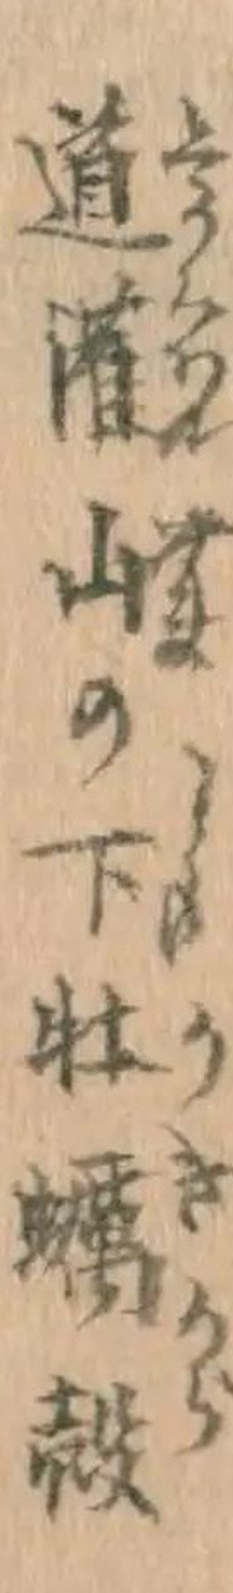道灌山の下牡蠣殻
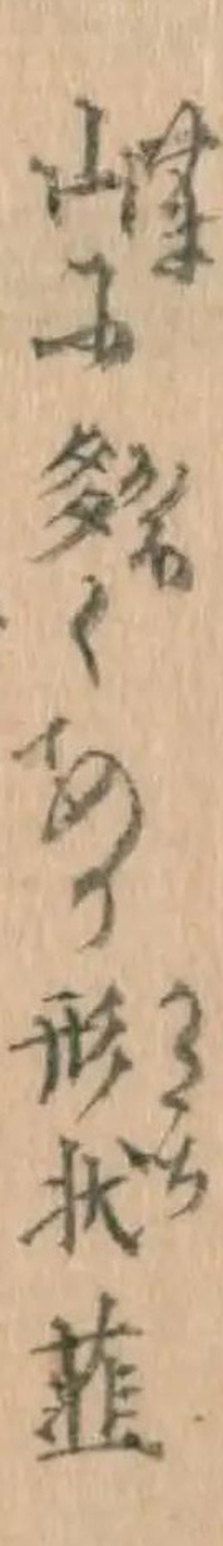山に多くあり形状韮
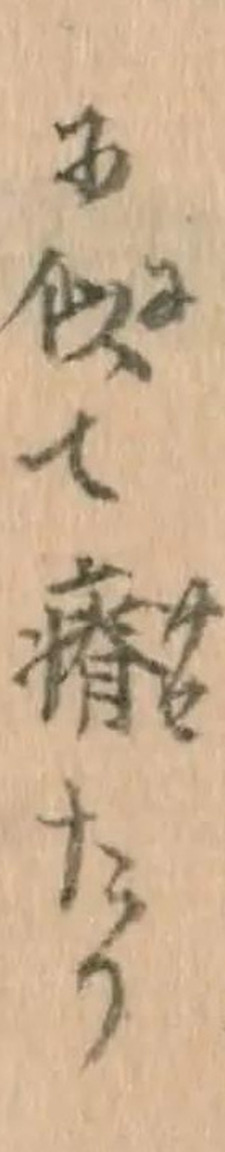に似て瘠たり

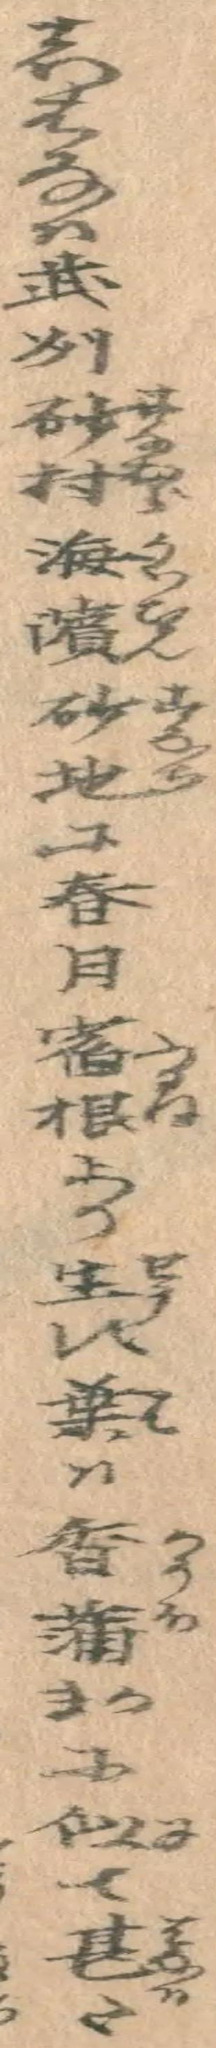しはなは武州砂村海浜砂地に春月宿根より生す葉は香蒲かまに似て甚た
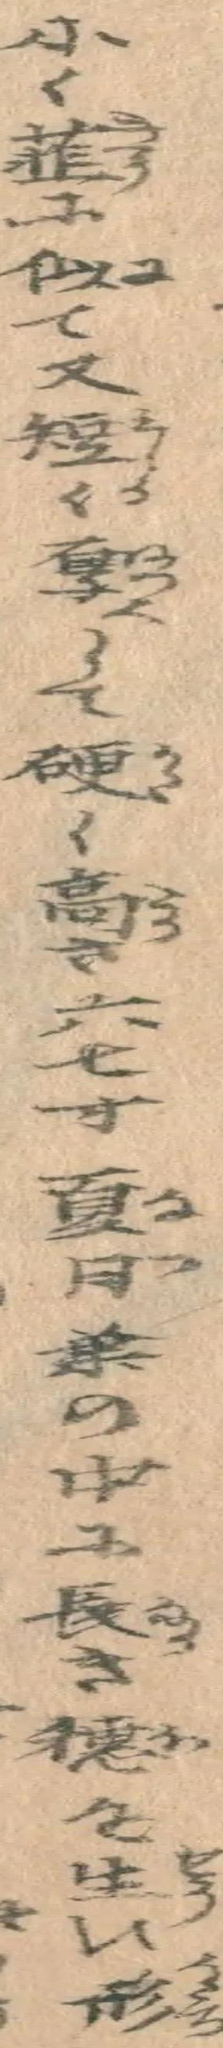小く韮に似て又短く厚して硬く高さ六七寸夏月葉の中に長き穂を生す形
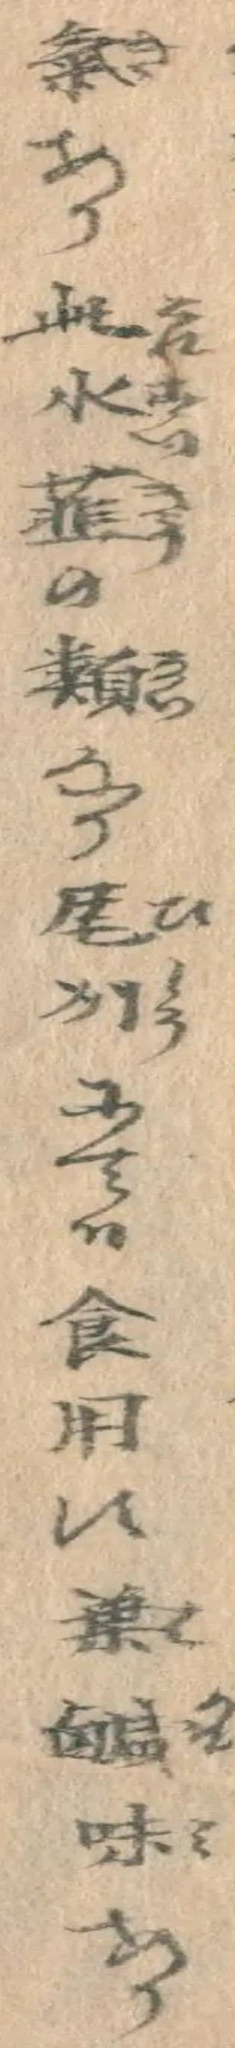気あり此水韮の類なり尾州にては食用す葉鹹味あり
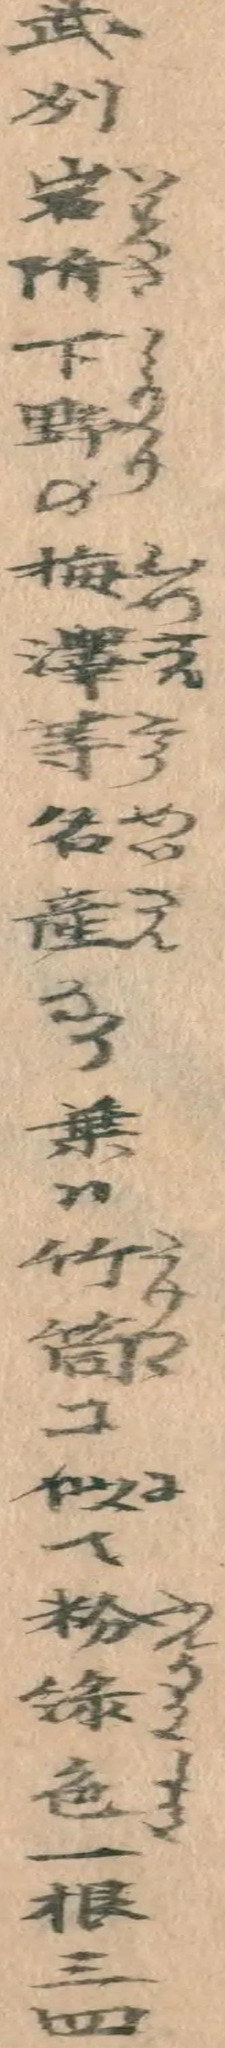武州岩附下野の梅沢等名産なり葉は竹筒に似て粉緑色一根三四
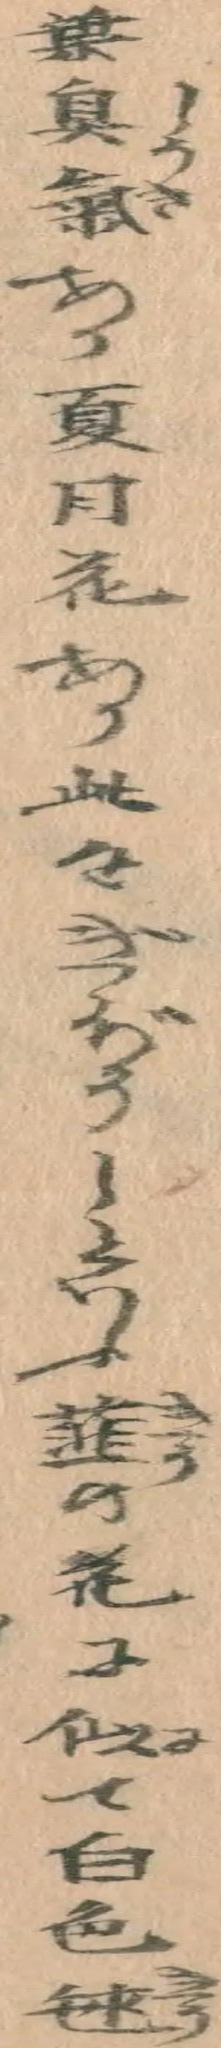葉臭気あり夏月花あり此をぎぼうしといふ韮の花に似て白色毬
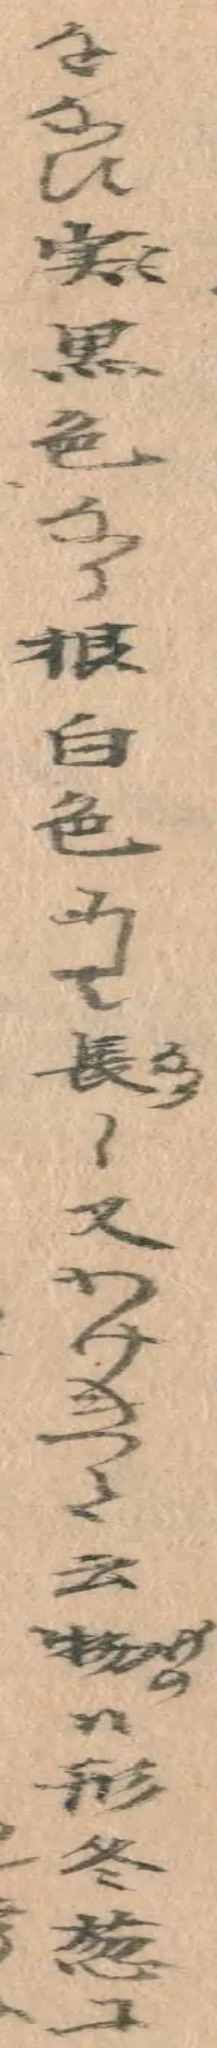をなす実黒色なり根白色にして長し又わけきと云物は形冬葱に
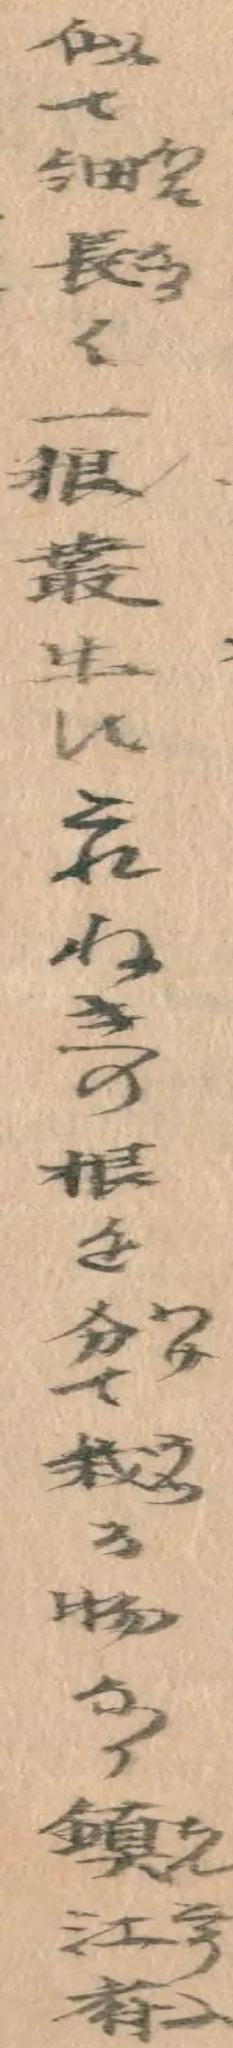似て細長く一根叢生すこれねきの根を分て栽る物なり鎮江府
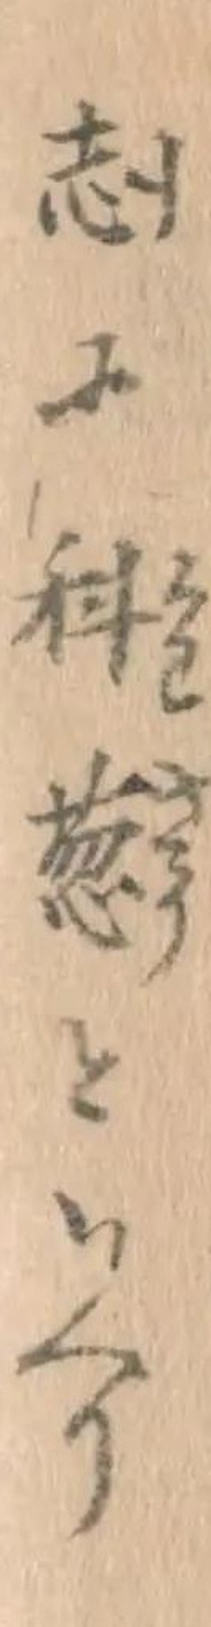志に科葱といへり

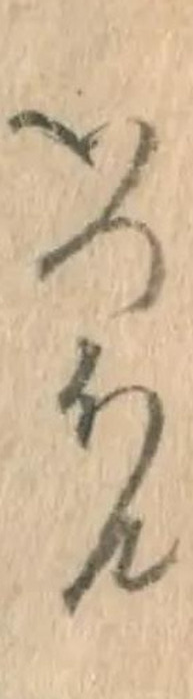いつほん
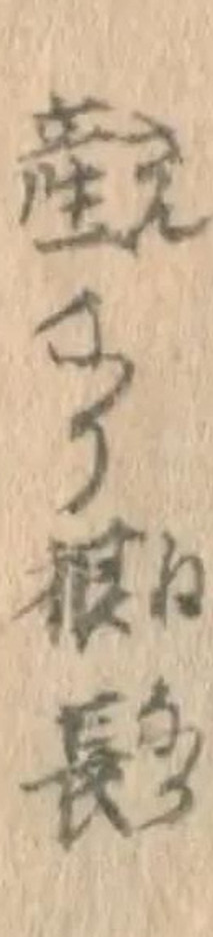産なり根長
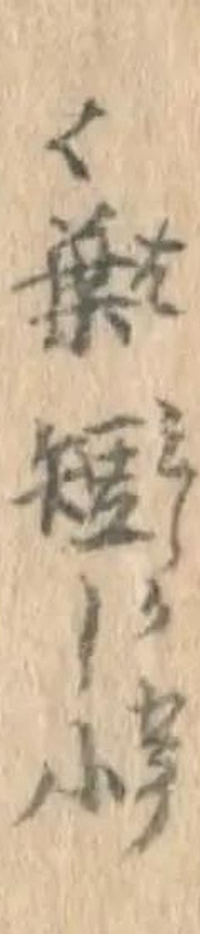く葉短し小
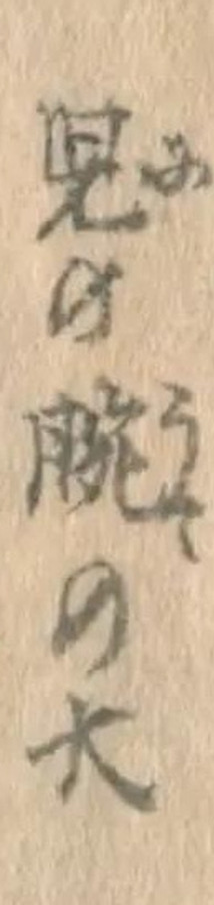児の腕の大
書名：本草図譜. 巻43-45
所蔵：国立国会図書館 National Diet Library, JAPAN
